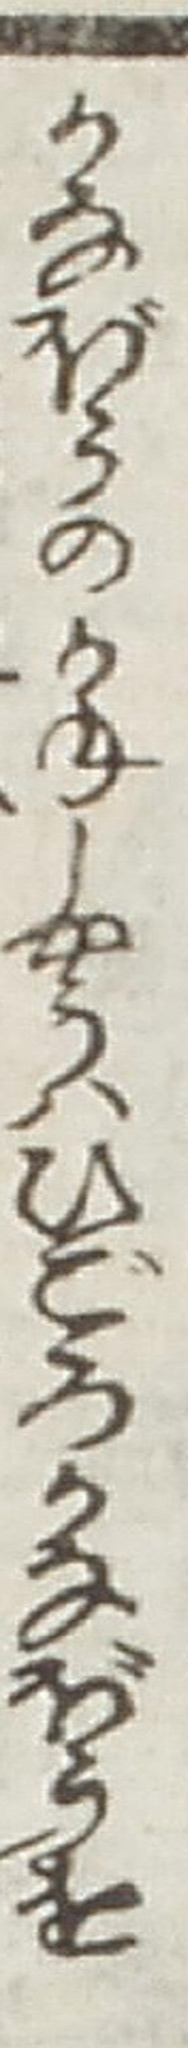かなぼうのかねしやうはひごろかなぼうを
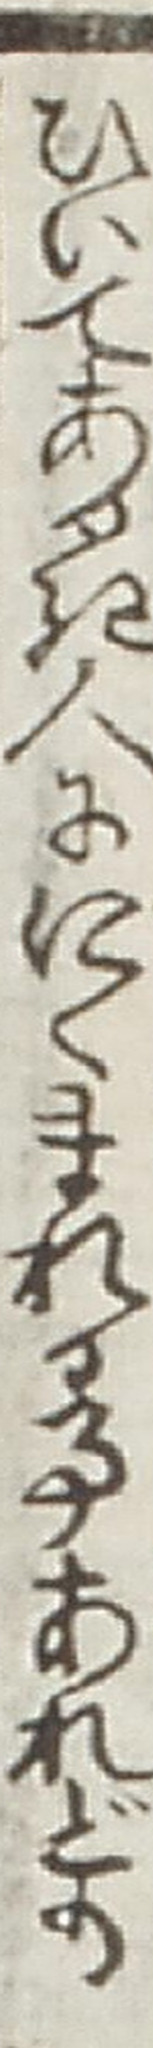ひいてあるき人ににくまれる事あれども
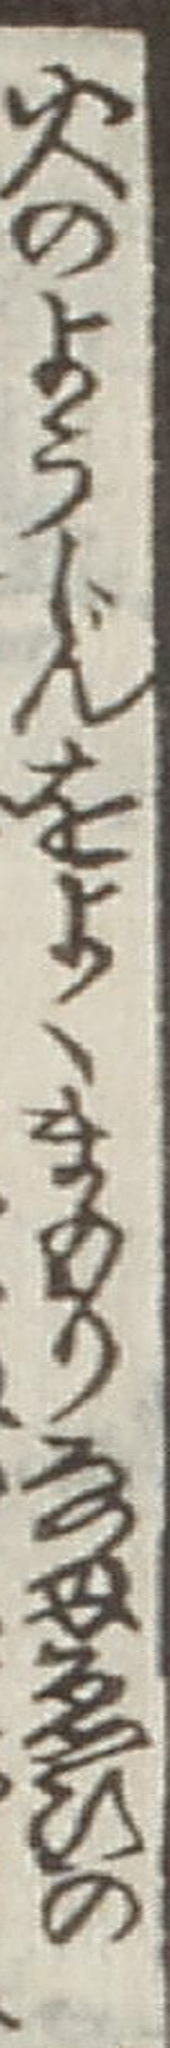火のようじんをよくまもりなまゑひの
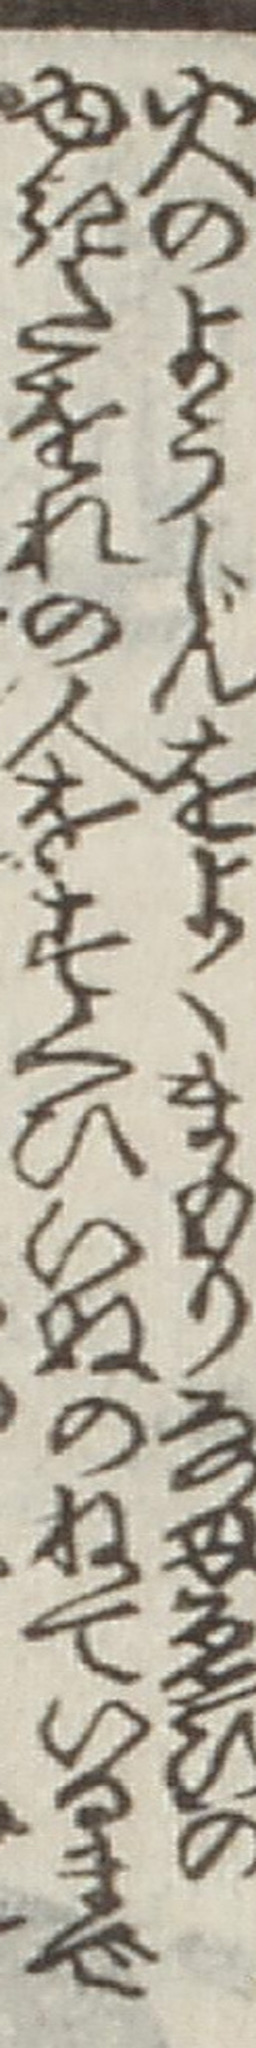ゆきたをれの人をすくひいぬのねているまで
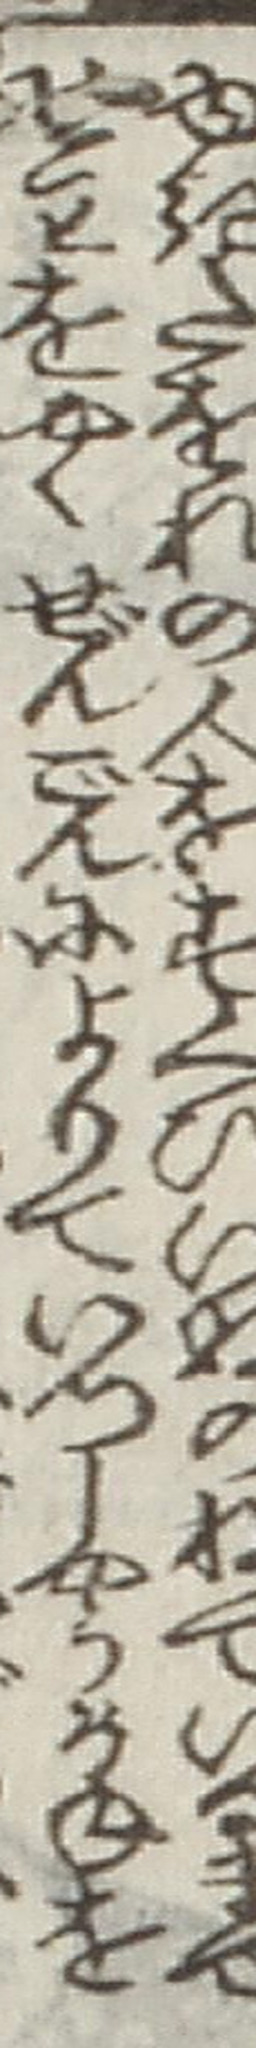せわをやくぜんごんによりていつしやうかねを
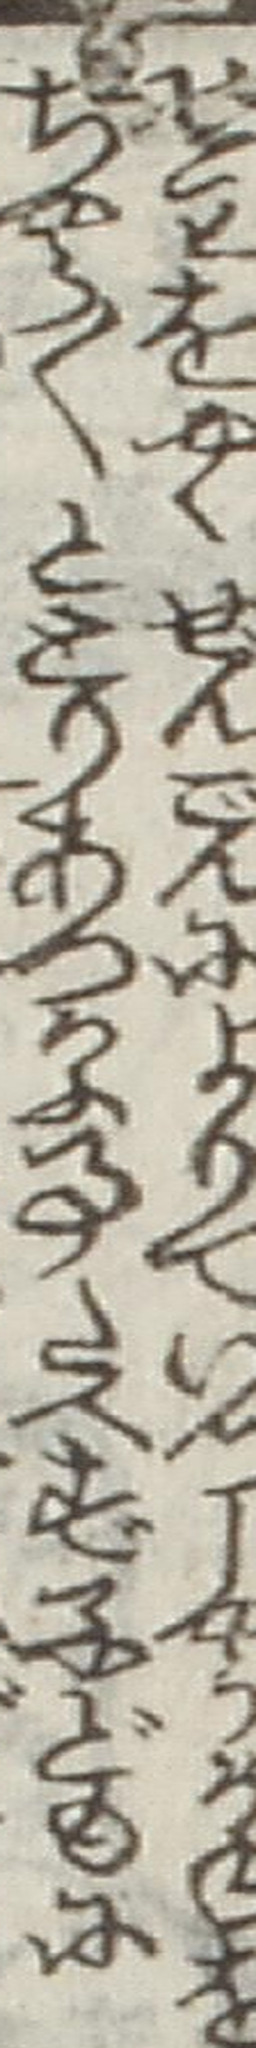ちやら〳〵ととりあつかふ事たへず子どもに
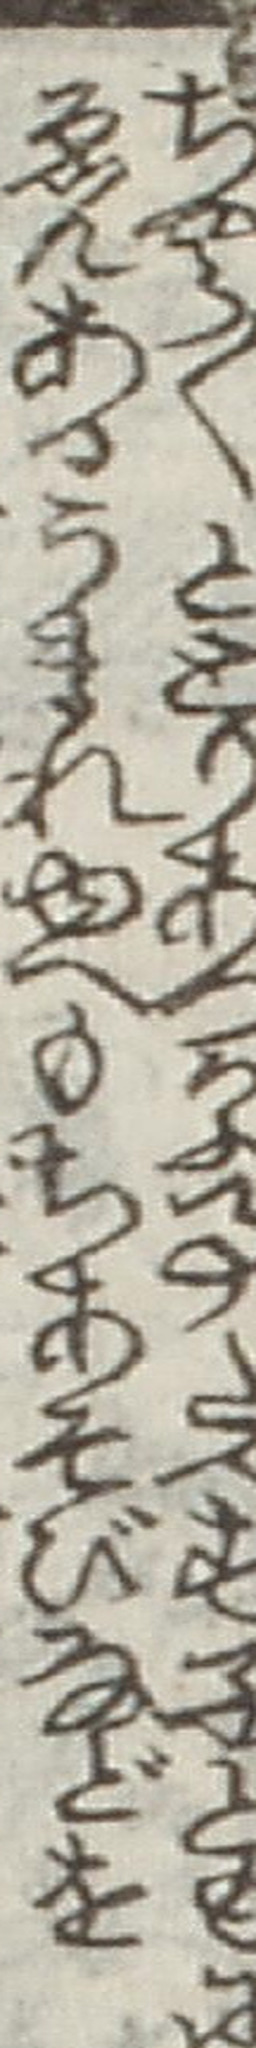ゑんあるうまれゆへもちあそびなどを
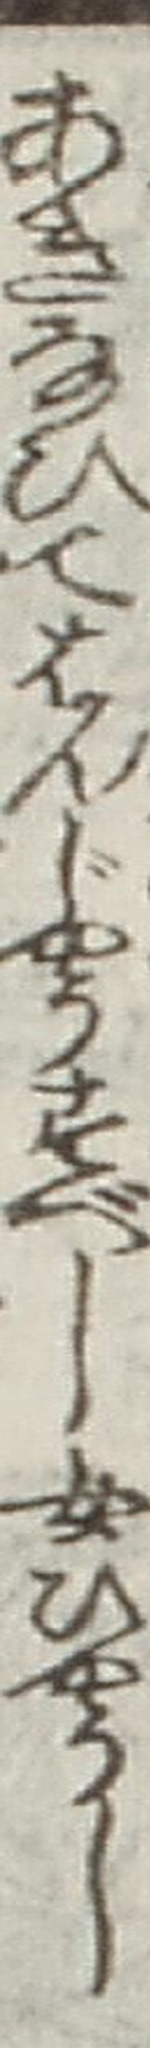あきなひてはんじやうすべし女ひやうし
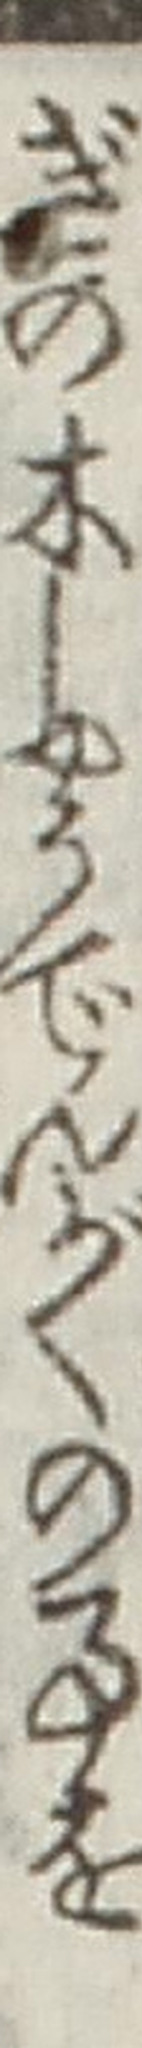ぎの木しやうでんがくの事を
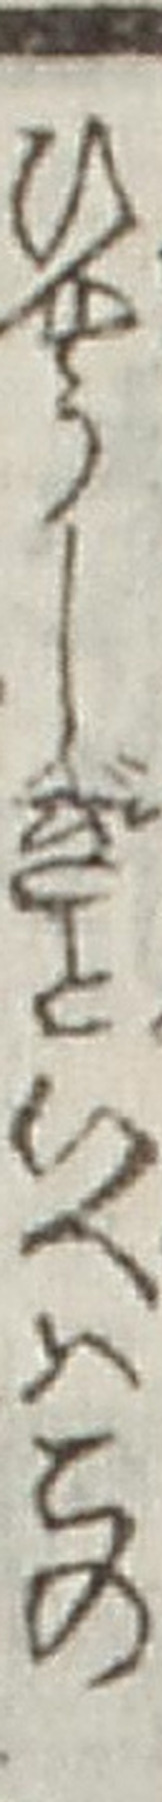ひやうしぎといへばこの
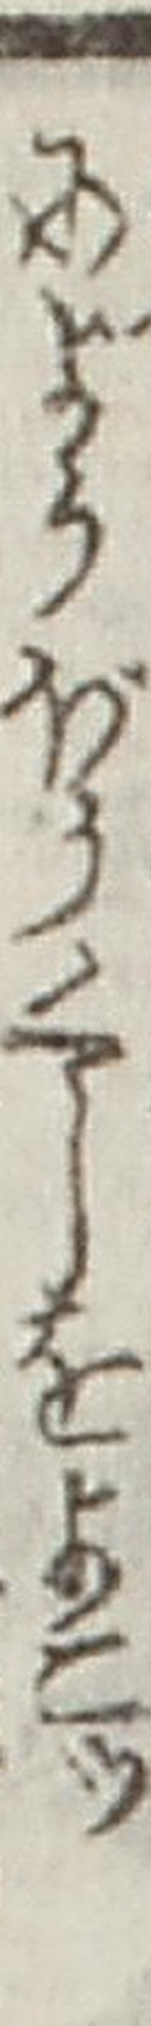にようぼうくしをよこッ
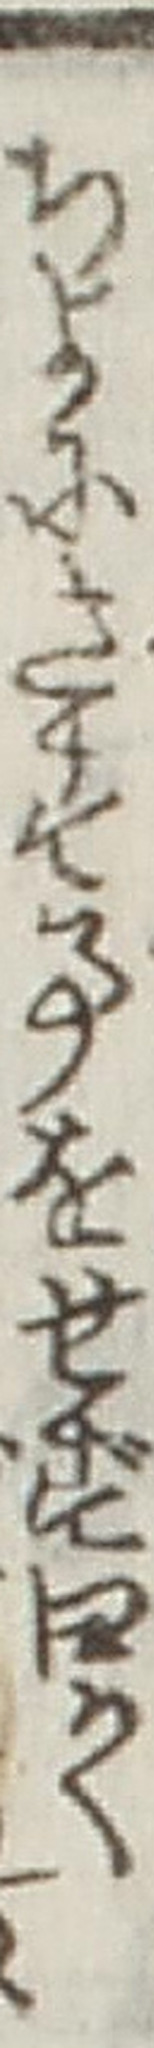ちよにさす事をせず曰はく
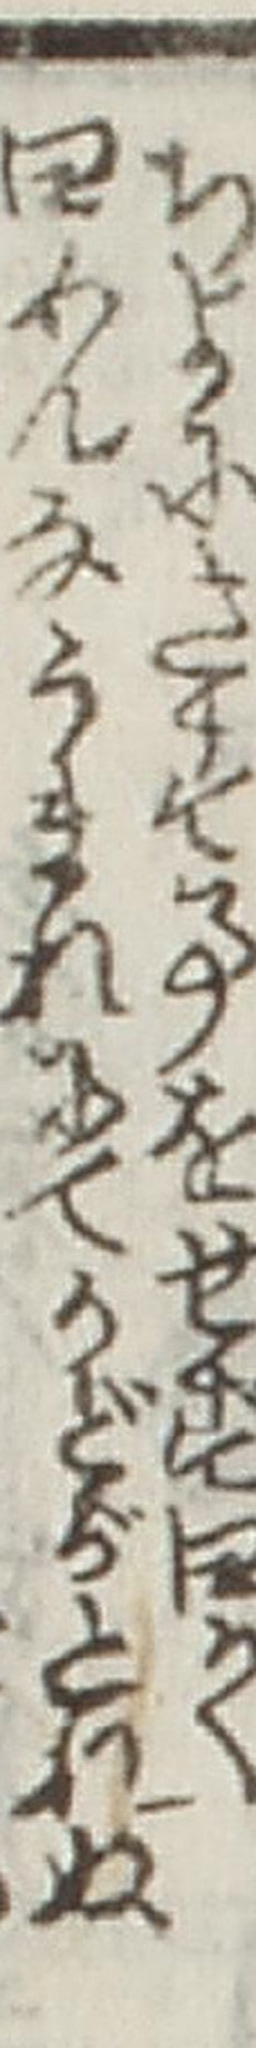曰わんなうまれにてかどがとれぬ
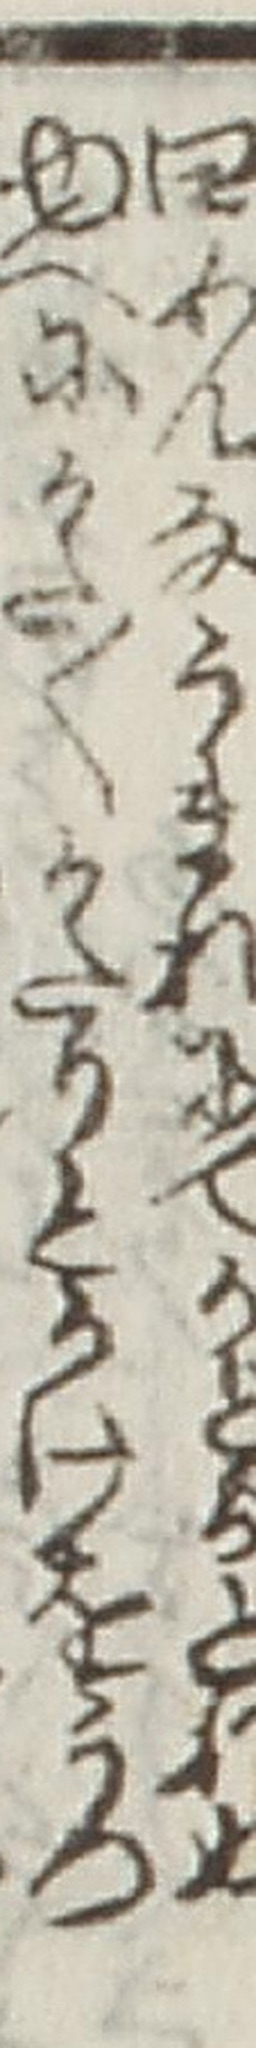ゆへにかたくかたりとかけををうつ
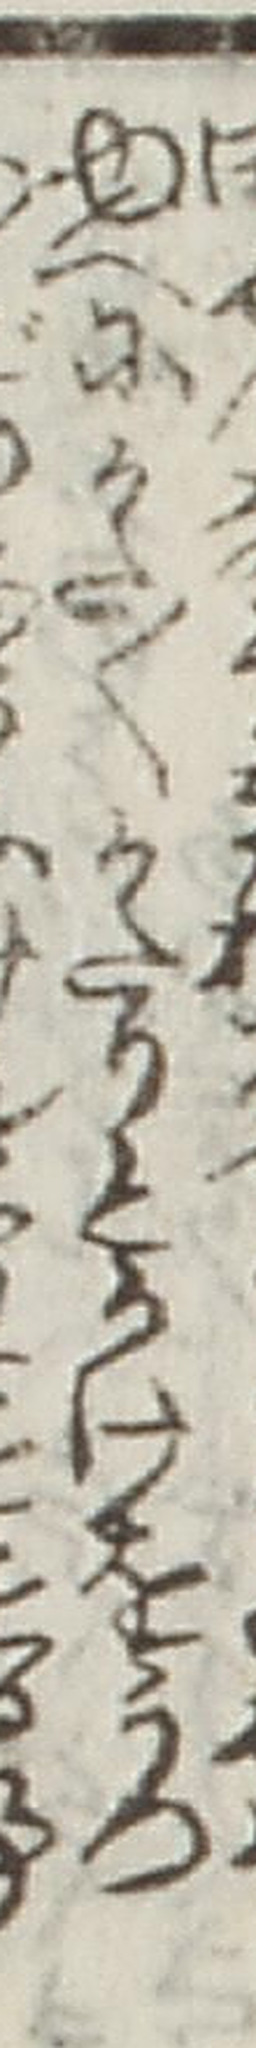ゆへにかたくかたりとかけををうつ
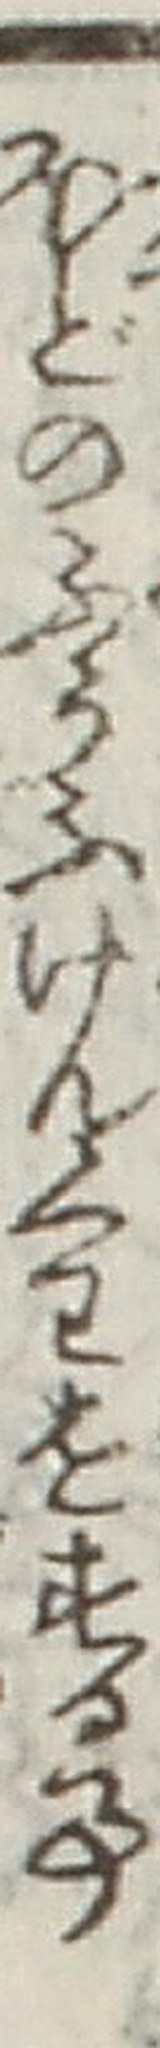ほどのふうふけんくわをする事
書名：三世相出雲當座帳　上下冊
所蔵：東京大学地震研究所図書室 Earthquake Research Institute Library, The University of Tokyo, JAPAN
